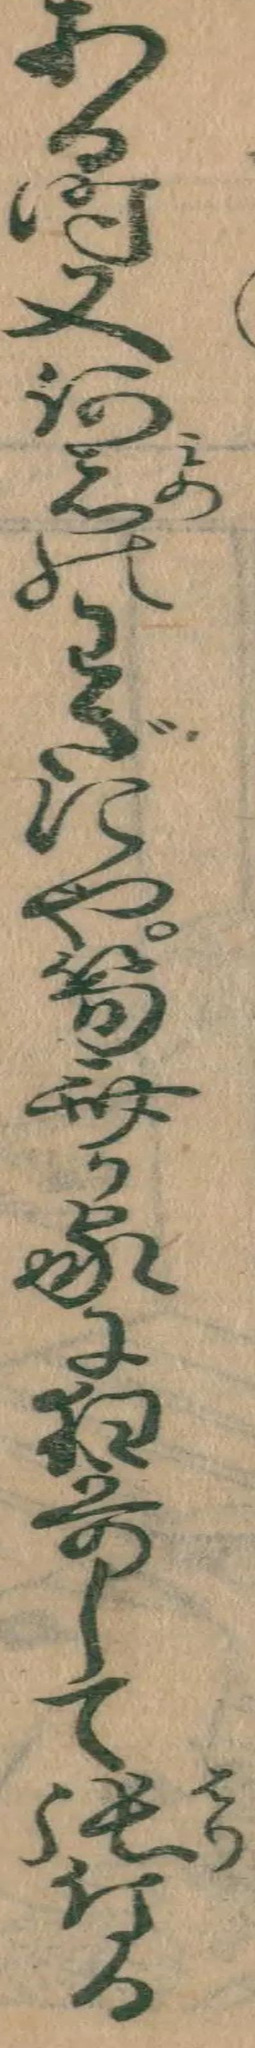ある時又河者のわざにや。筍斎か家に狂歌して張付る
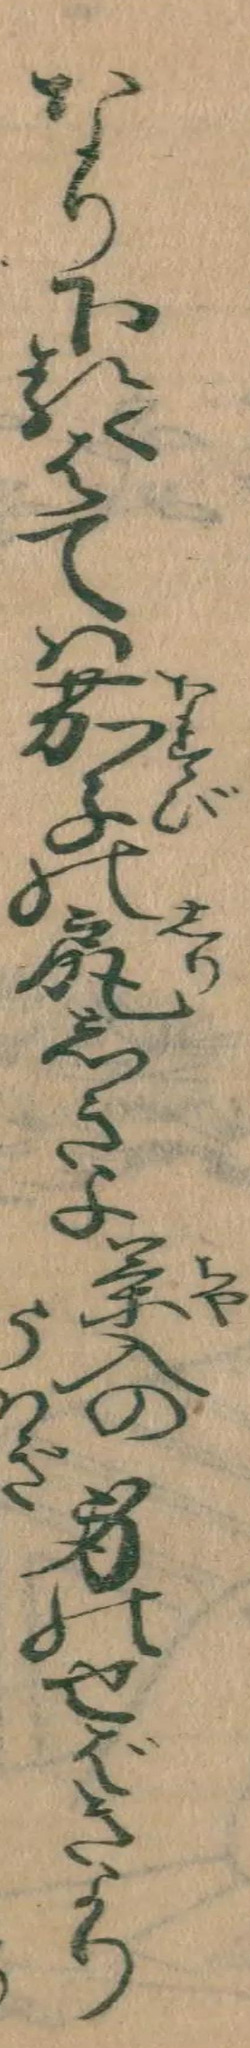なり下るはては茄子の尻しきよ茶入のうはぎ身のせばきより
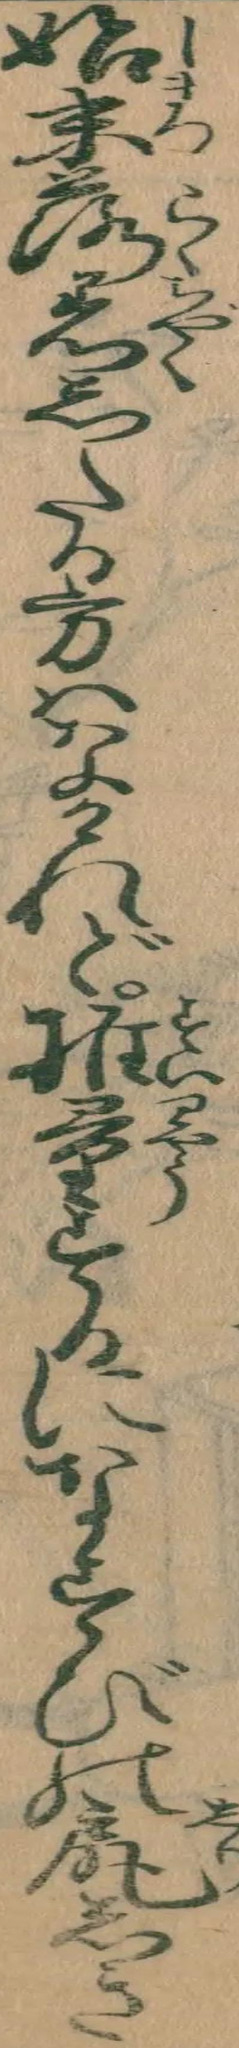始末落着したる方はなけれど。推量するになすびの尻しき
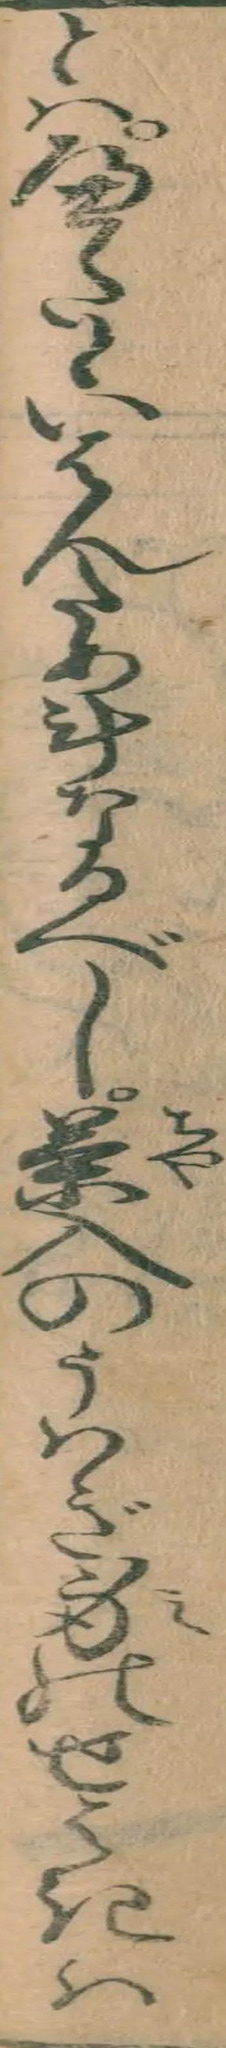とは。へたといはんため計なるべし。茶入のうはぎ身のせはきは
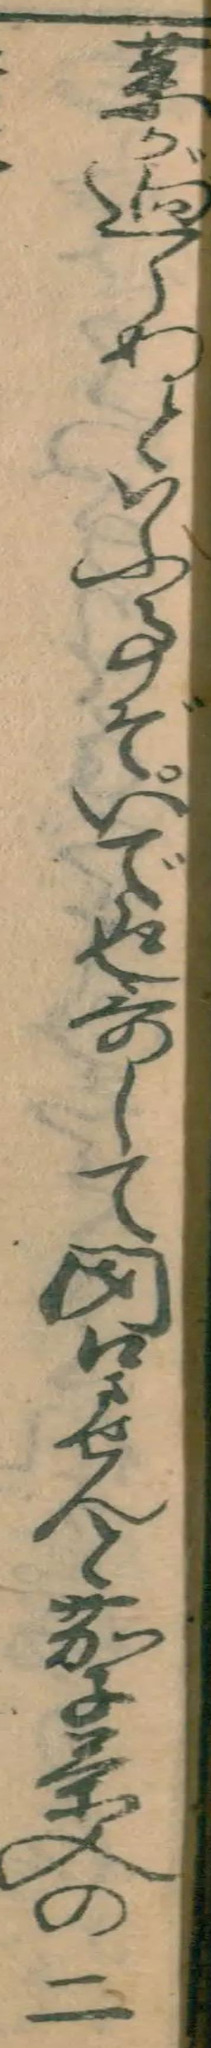薬が廻らぬといふ事ぞ。いで返歌して閉口させんと茄子茶入の二
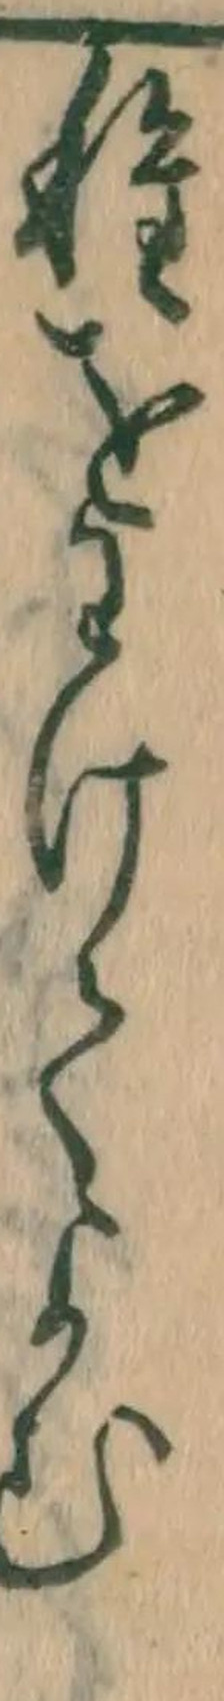種をわけてよむ
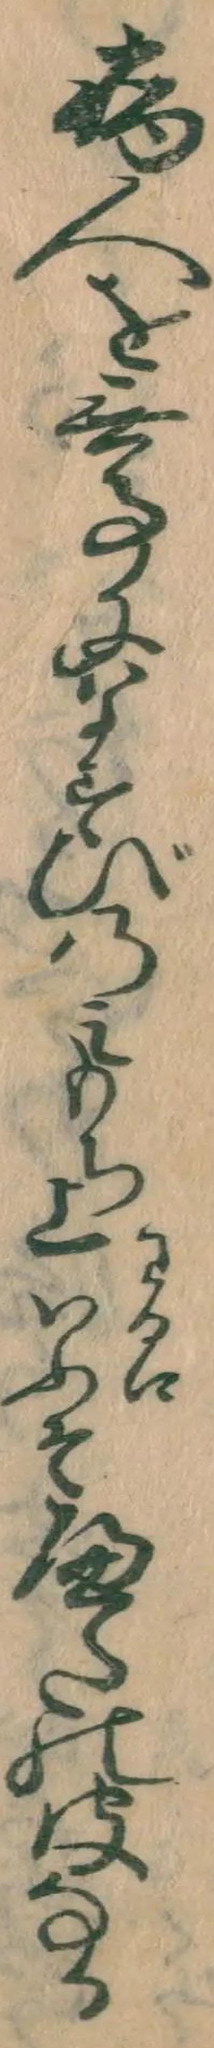病人を無事になすびのみもち上わる口いふそへたの皮なる
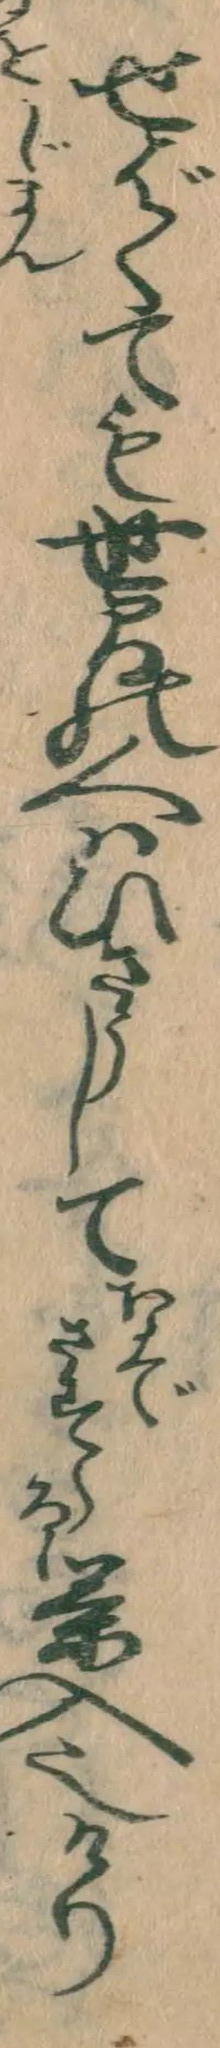せばくても世間の人はひさうしてなでさすらるし茶入也けり
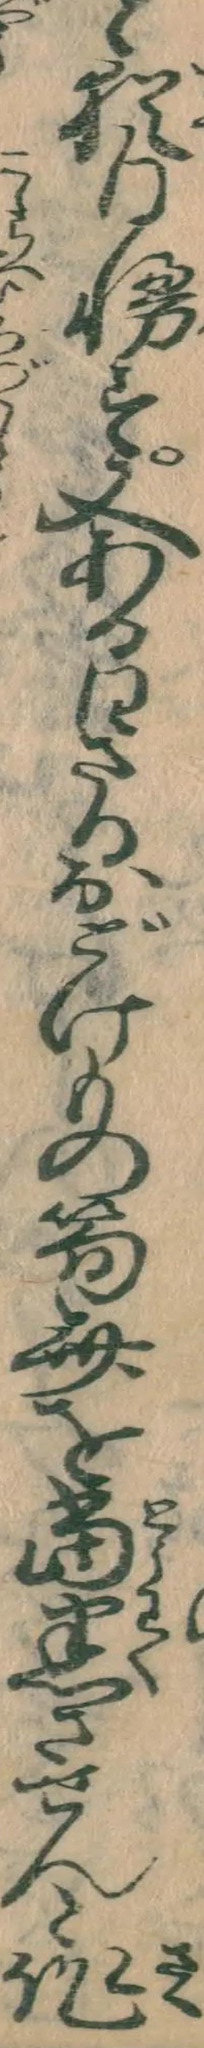と猶自慢す。又ある日さるおどけもの筍斎を当惑させんと作
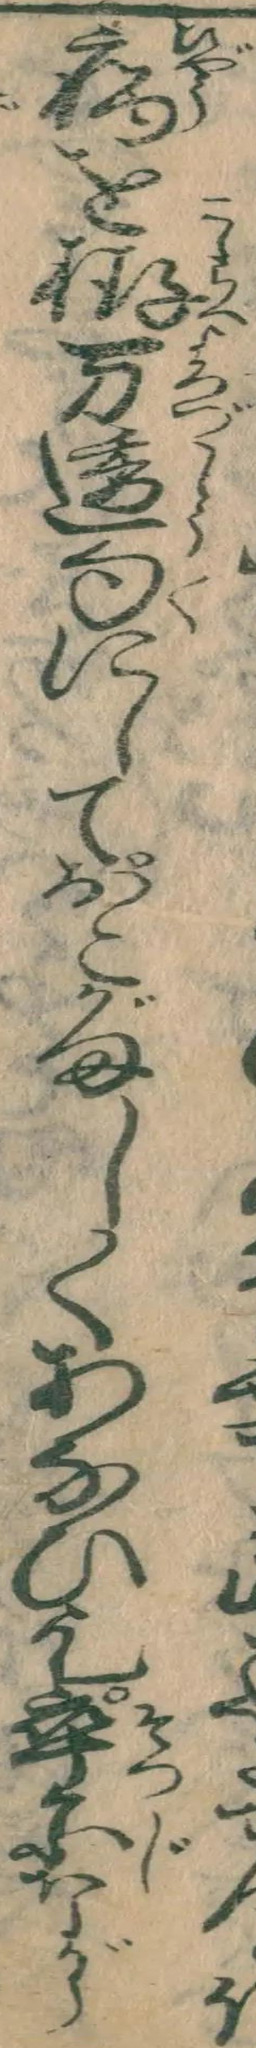病を拵万透句にして。おこがましくあなひ乞。卒爾ながら
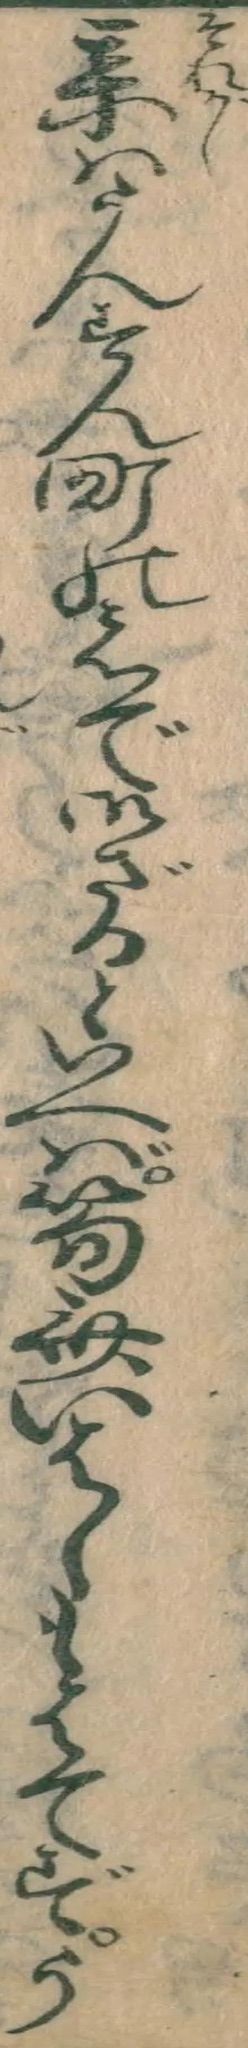某はうんすん町の者で御ざるといへば。筍斎いはしもはてず。う
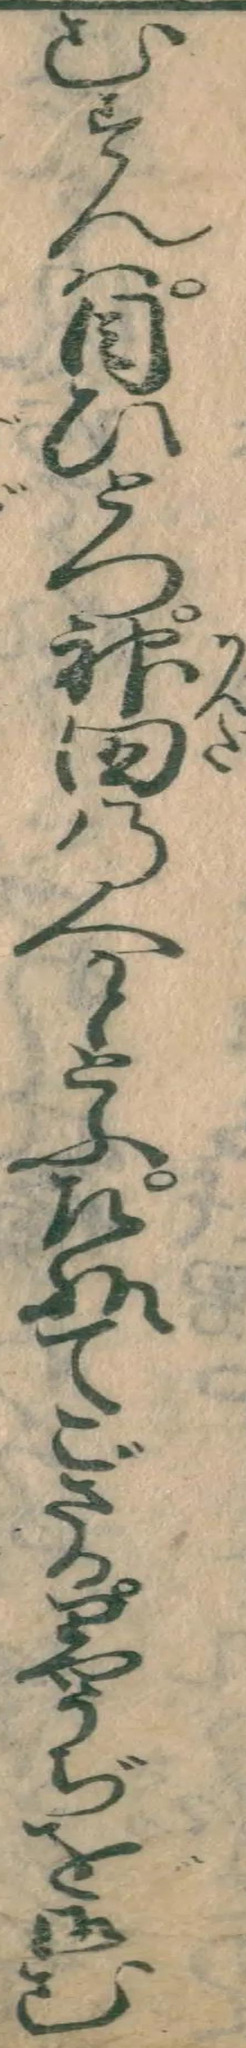むすんは。目ひとつ。神田の人かととふ。左様てごさる。りやうぢを御む
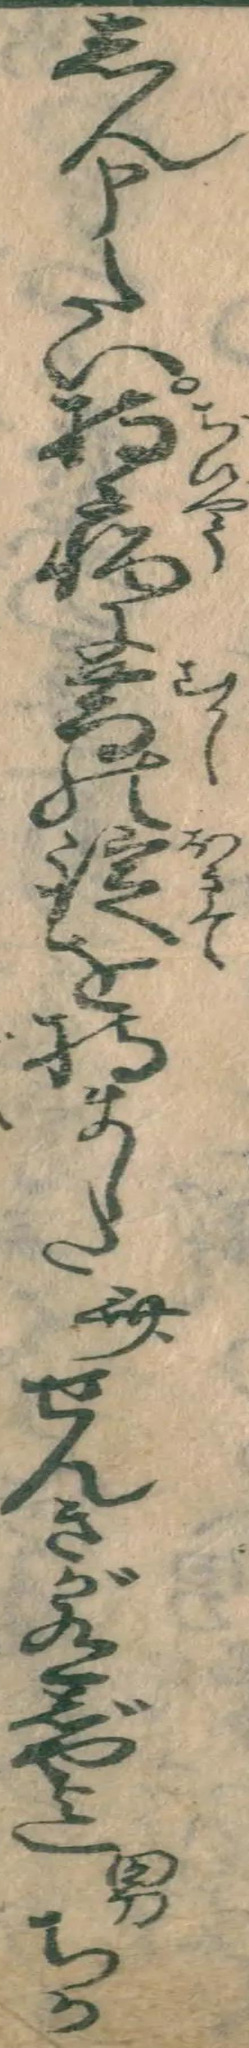しん申たい。持病に昔の諚を持ました斎せんきが有じや迄男ちか
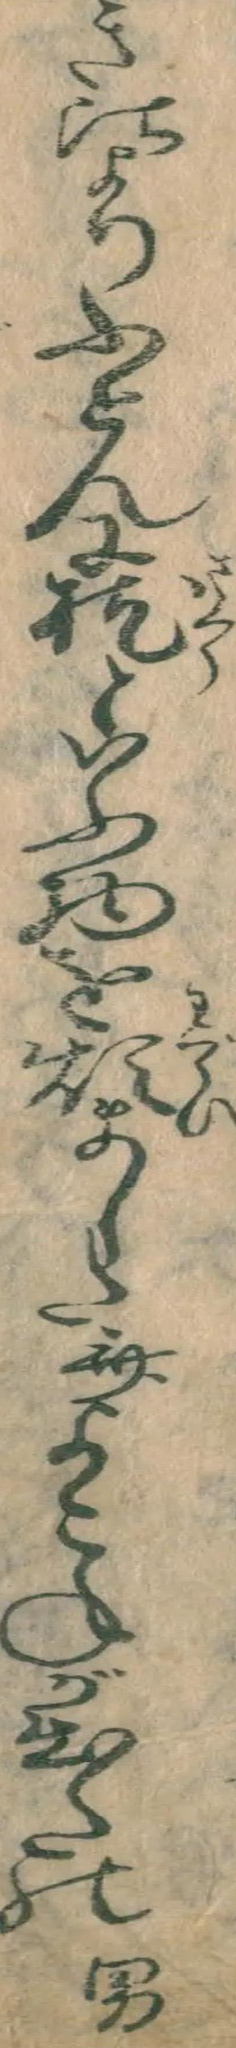き比よりふとんに枕といふ物を煩ました斎よこねが出たの男
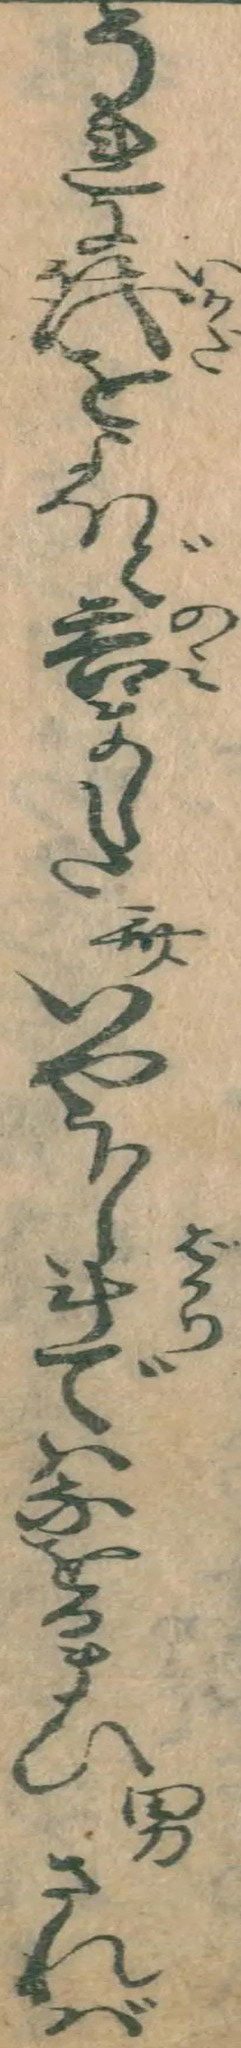それに筏をよほど呑ました斎いや下し計ではなをるまひ男されば

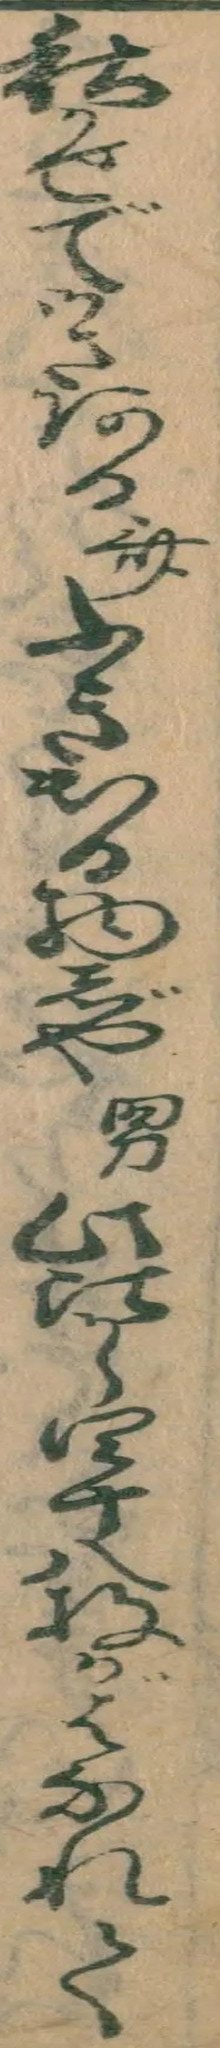秋かせで御さある斎ふき出る物じや男此比から四十八枚がはなれて
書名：新竹斎 5巻
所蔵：国立国会図書館 National Diet Library, JAPAN
